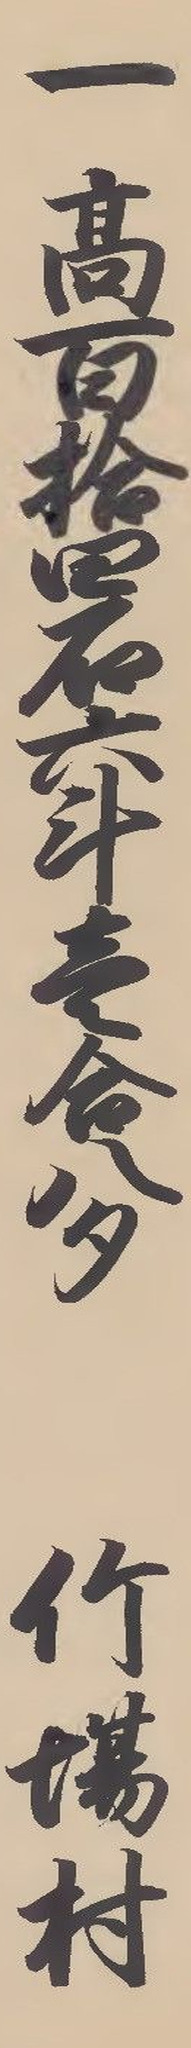一高百拾四石六斗壱合八勺竹場村
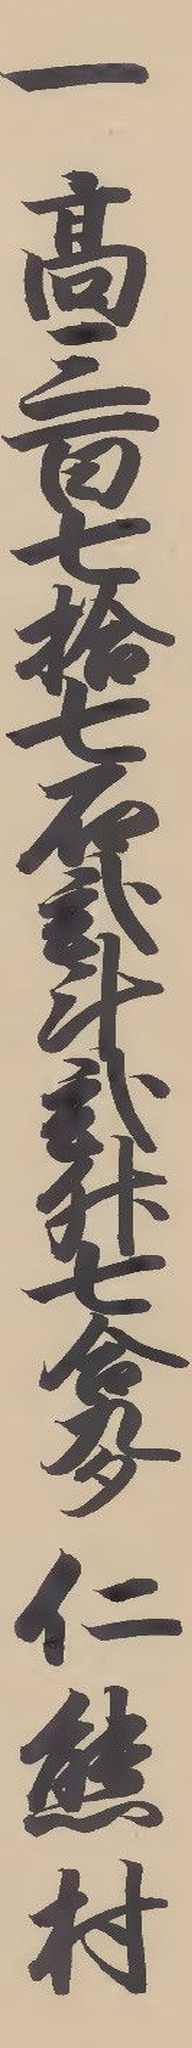一高三百七拾七石弐斗弐升七合九勺仁熊村
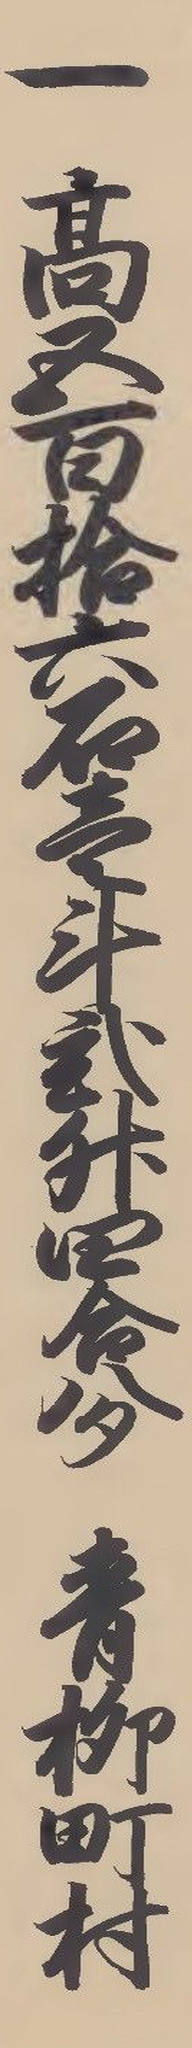一高五百拾六石壱斗弐升四合八勺青柳町村

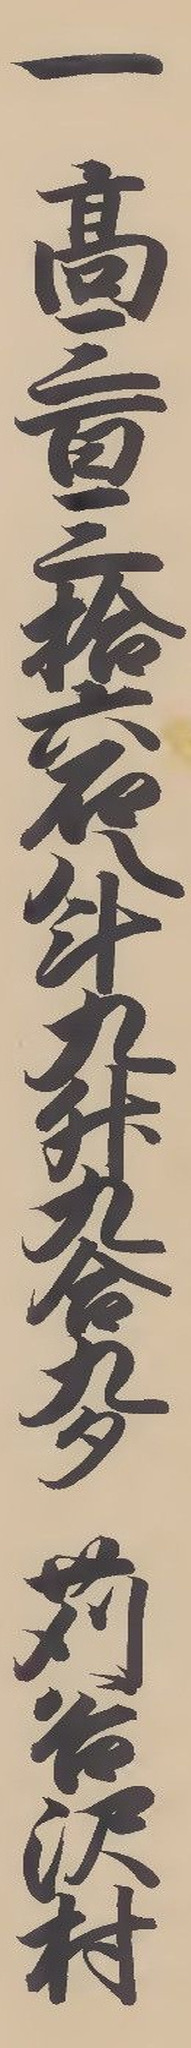一高三百三拾六石八斗九升九合九勺刈谷沢村
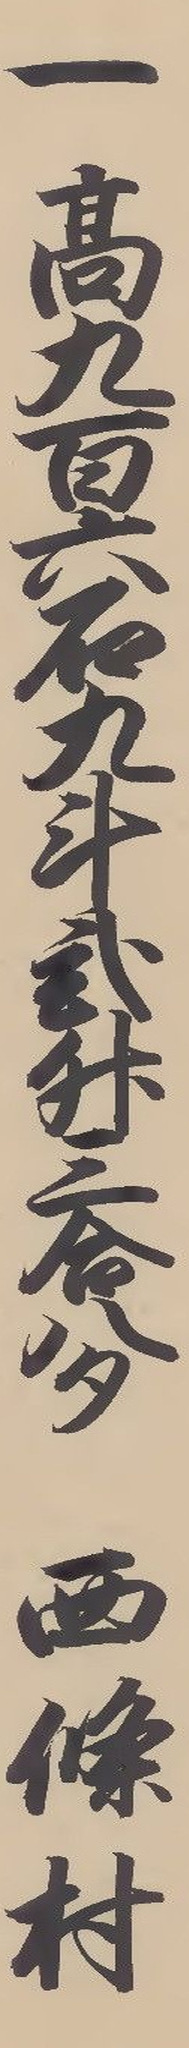一高九百六石九斗弐升三合八勺西条村
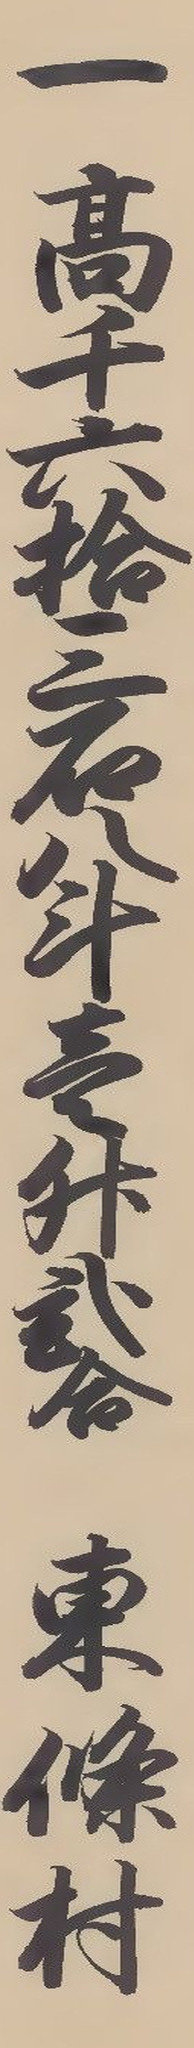一高千六拾三石八斗壱升弐合東条村
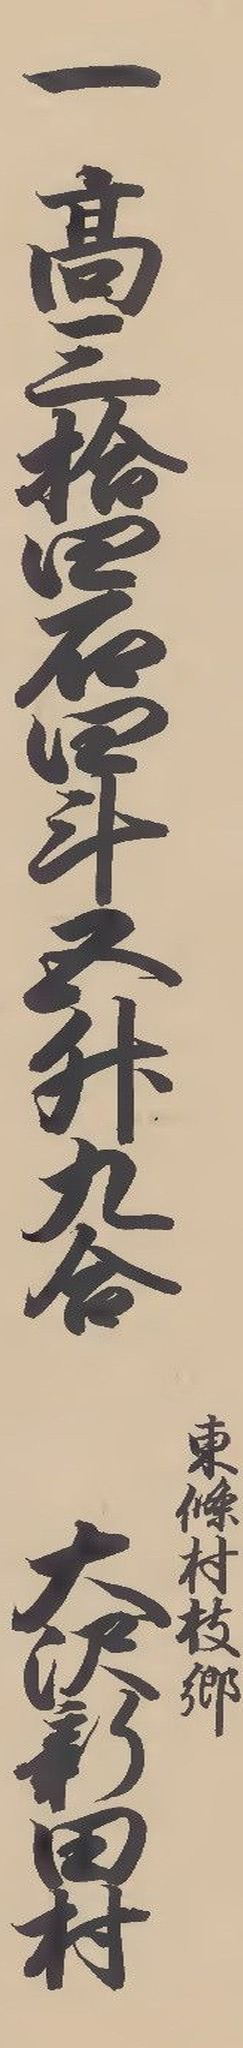一高三拾四石四斗五升九合大沢新田村
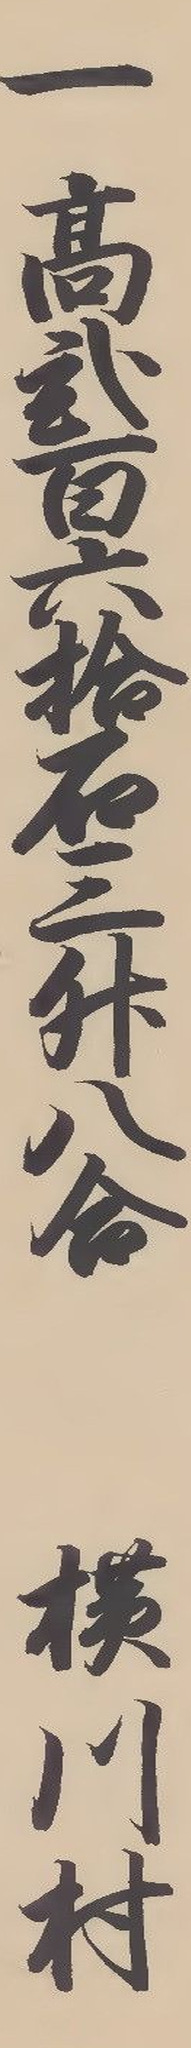一高弐百六拾石三升八合横川村
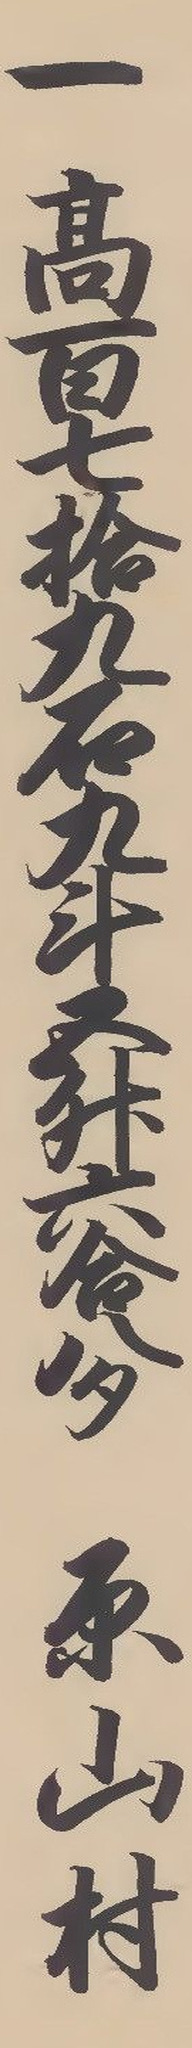一高百七拾九石九斗五升六合八勺原山村

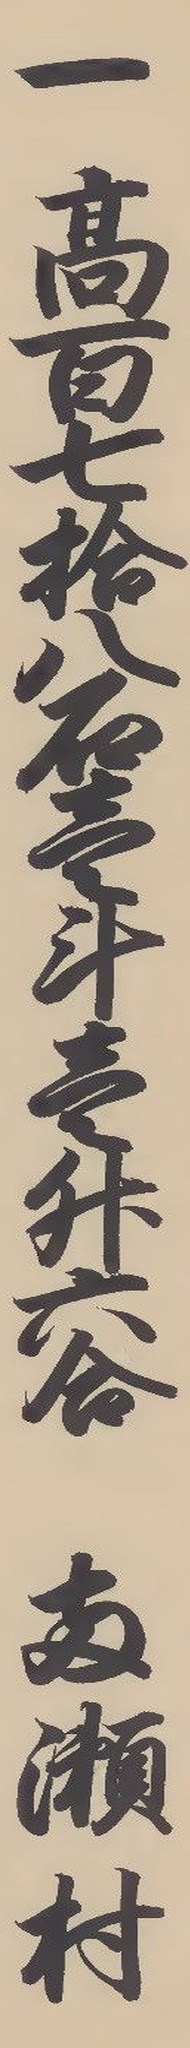一高百七拾八石壱斗壱升六合両瀬村
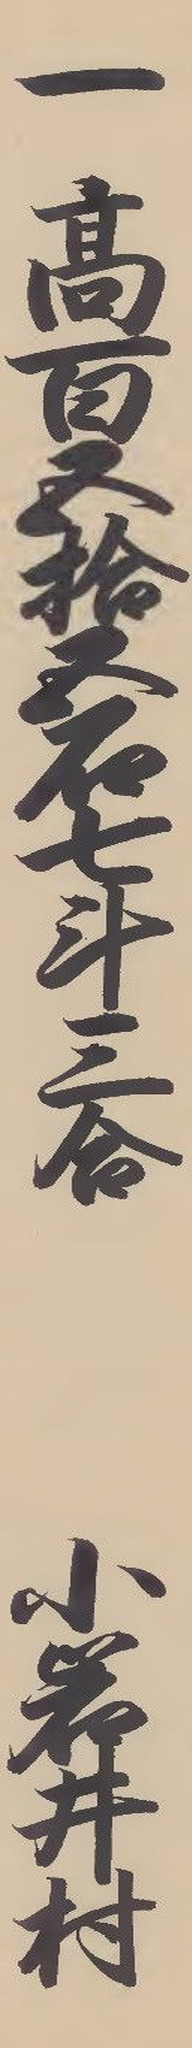一高百五拾五石七斗三合小岩井村
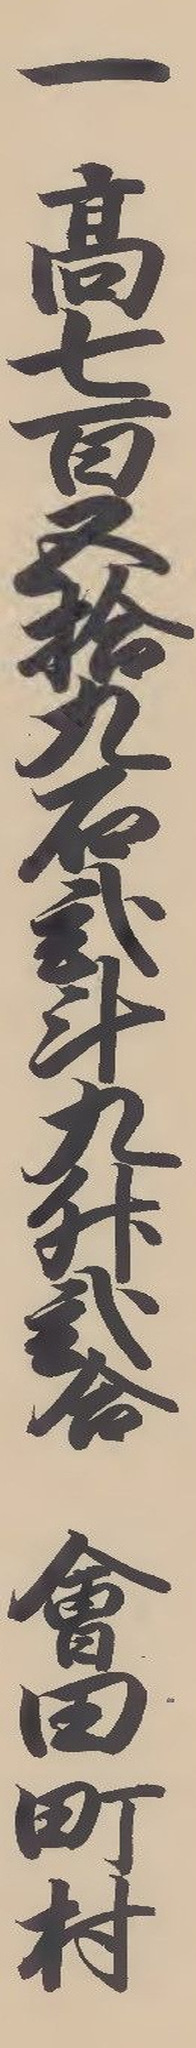一高七百五拾九石弐斗九升弐合会田町村
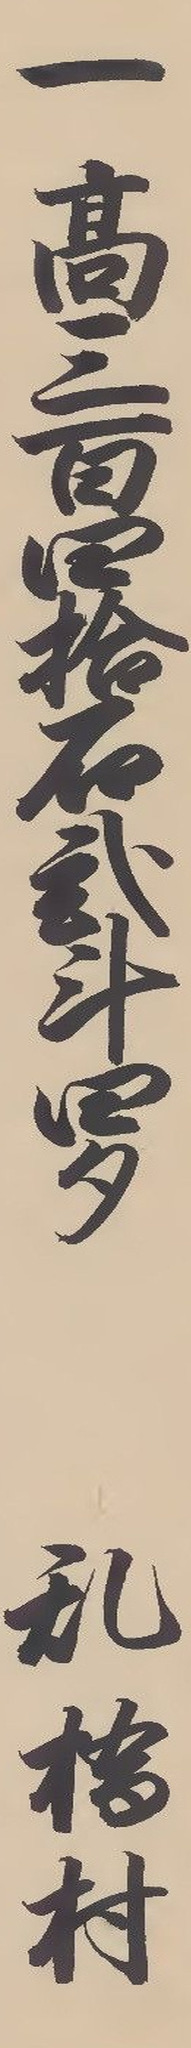一高三百四拾石弐斗四勺乱橋村
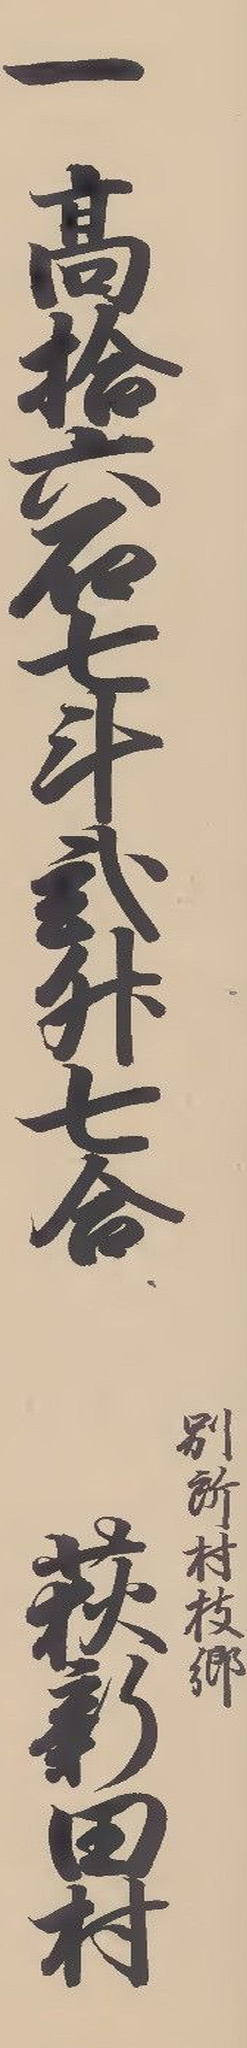一高拾六石七斗弐升七合荻新田村
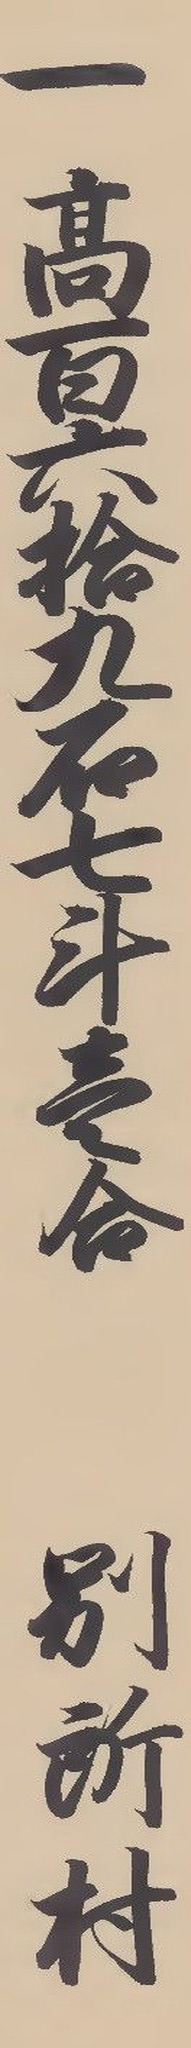一高百六拾九石七斗壱合別所村
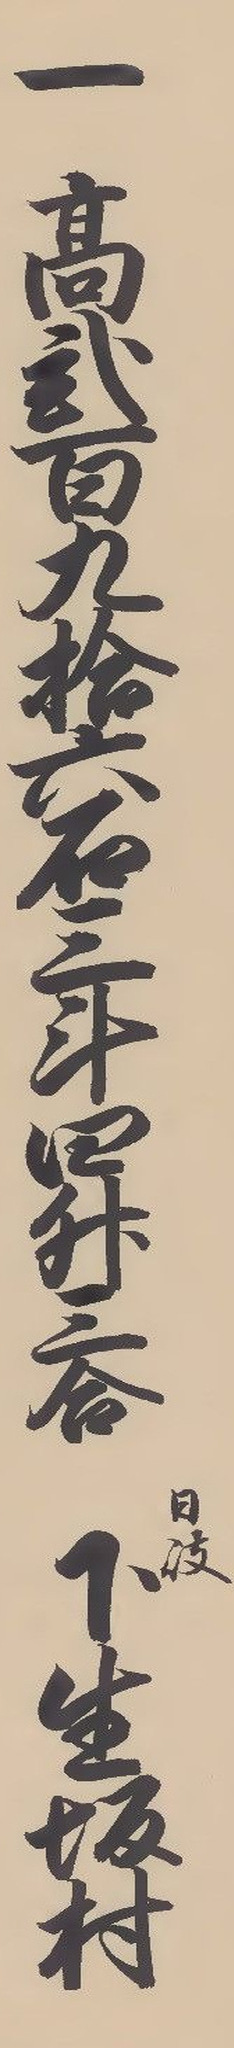一高弐百九拾六石三斗四升三合下生坂村
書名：信濃国郷帳
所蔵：国立公文書館 National Archives of Japan
